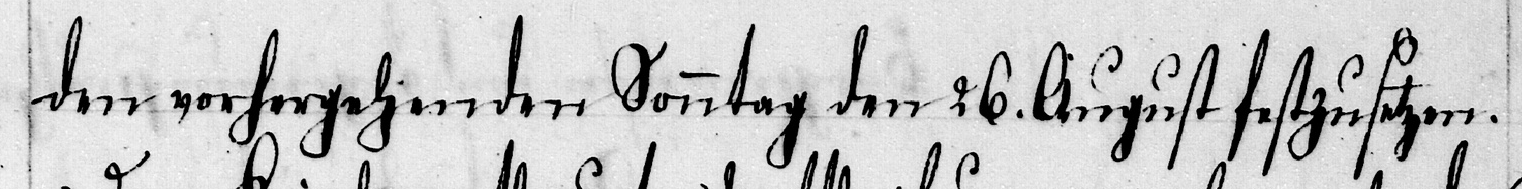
den vorhergehenden Sonntag den 26. August festzusetzen.
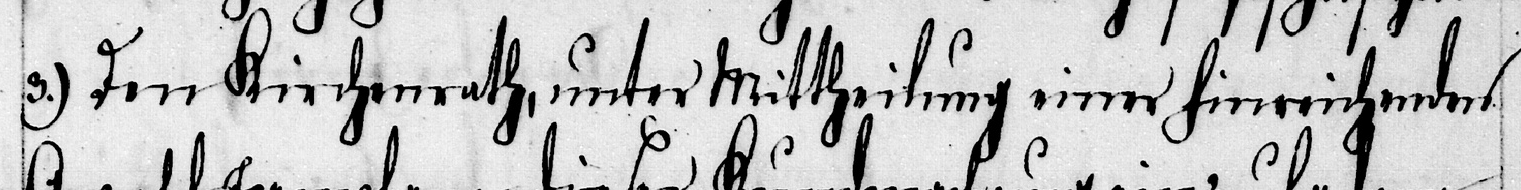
3.) Den Kirchenrath, unter Mittheilung einer hinreichenden
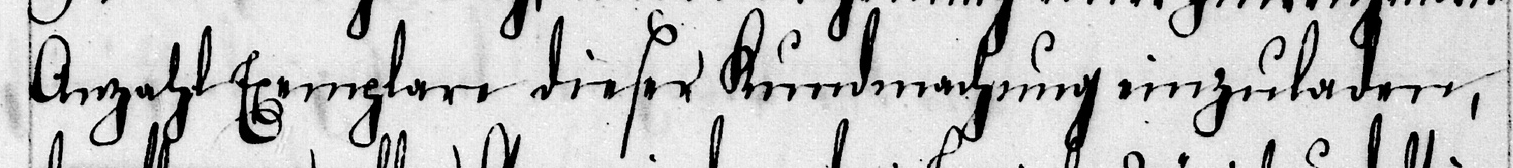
Anzahl Exemplare dieser Kundmachung einzuladen,
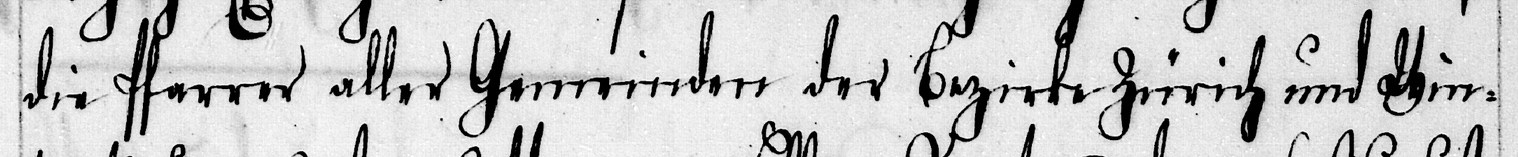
die Pfarrer aller Gemeinden der Bezirke Zürich und Win¬
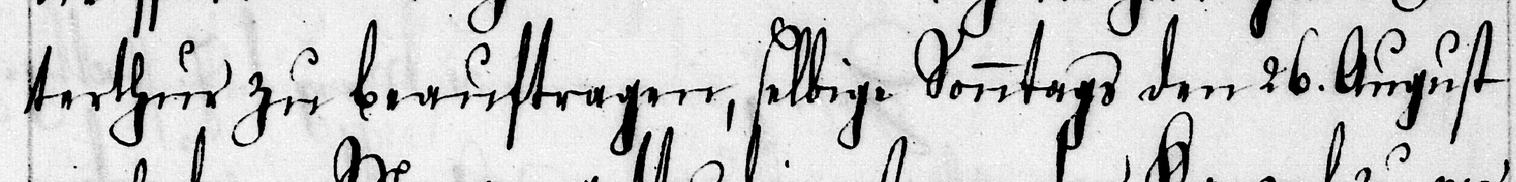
terthur zu beauftragen, selbige Sonntags den 26. August
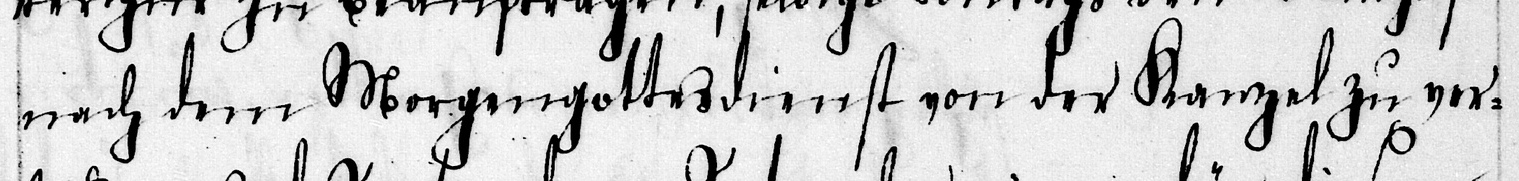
nach dem Morgengottesdienst von der Kanzel zu ver¬
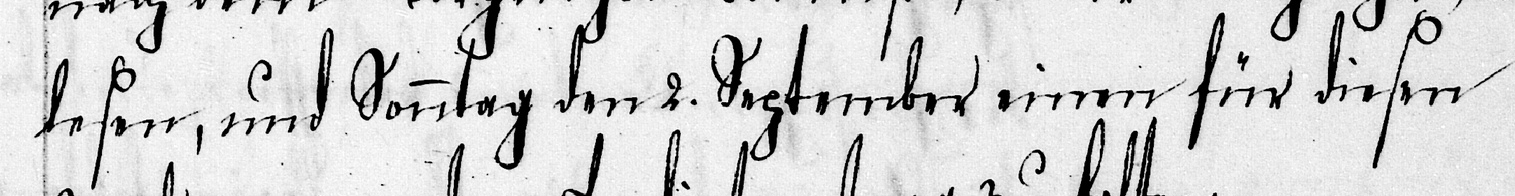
lesen, und Sonntag den 2. September einen für diesen
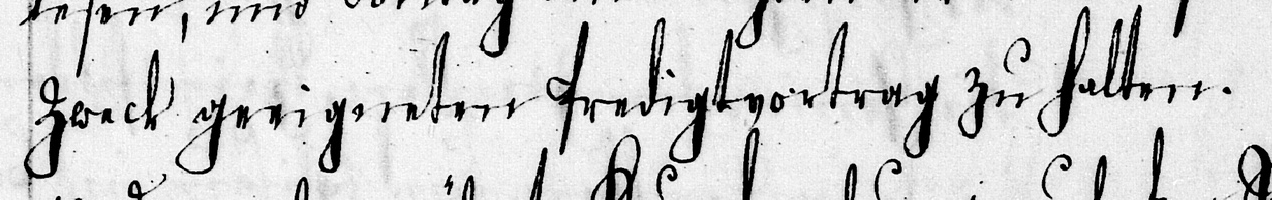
Zweck geeigneten Predigtvortrag zu halten.
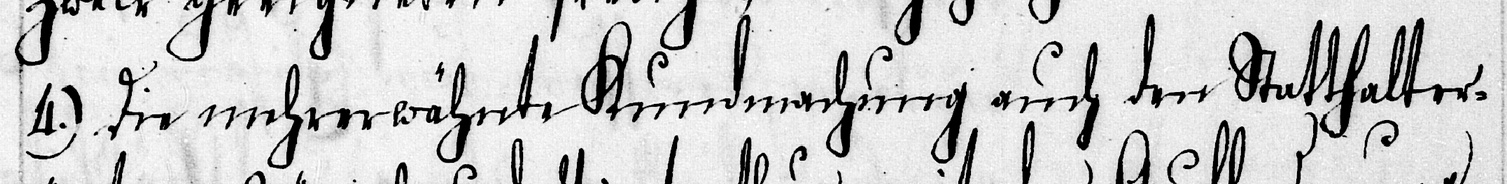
4.) Die mehrerwähnte Kundmachung auch den Statthalter¬
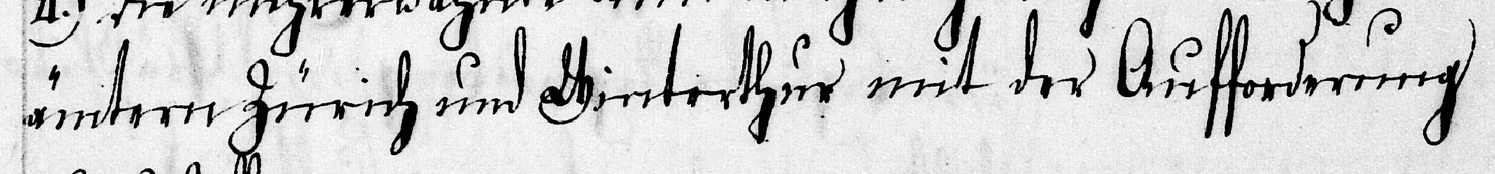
ämtern Zürich und Winterthur mit der Aufforderung
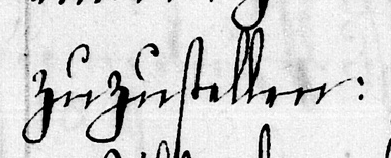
zuzustellen:
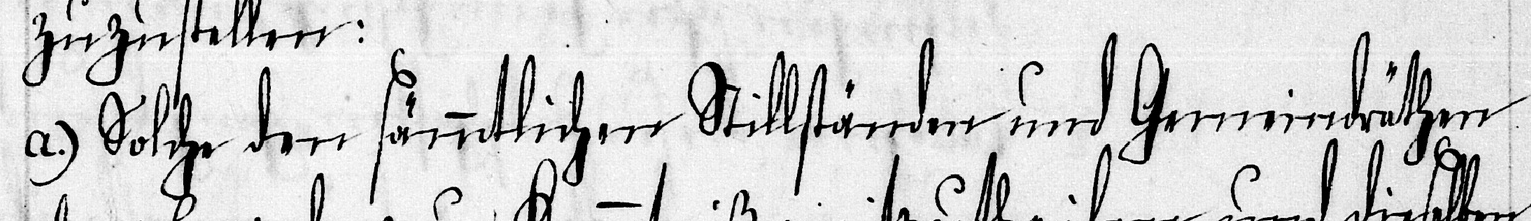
a.) Solche den sämmtlichen Stillständen und Gemeindräthen
